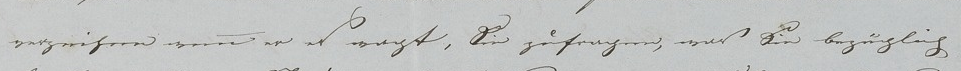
verzeihen wenn er es wagt, Sie zufragen, was Sie bezüglich
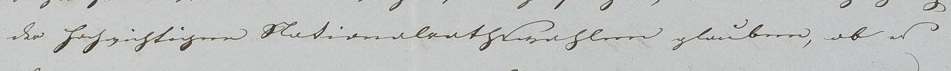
der hochwichtigen Nationalratswahlen glauben, ob es
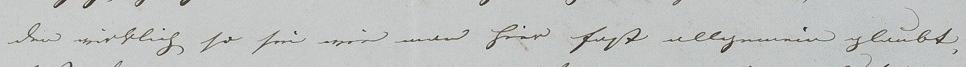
den wirklich so sei wie man hier fast allgemein glaubt,
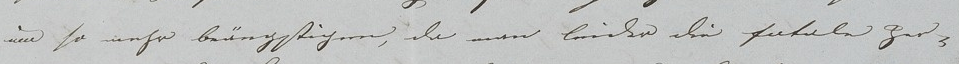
um so mehr beängstigen, da man leider die fatale Zer-
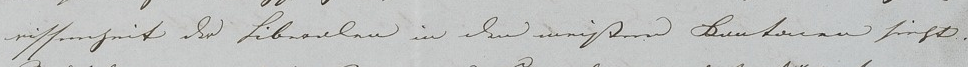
rissenheit der Liberalen in den meisten Kantonen sieht.
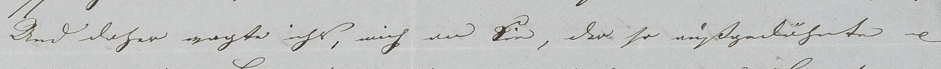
Und daher wagte ichs, mich an Sie, der so außgedähnte &
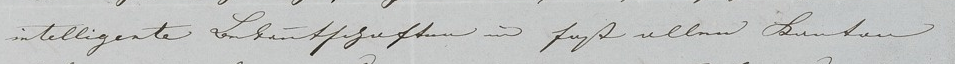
intelligente Bekanntschaften in fast allen Kantonen
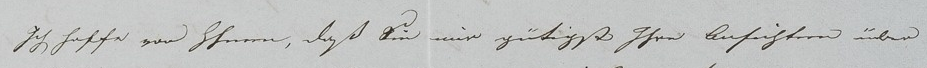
Ich hoffe von Ihnen, dass Sie mir gütigst Ihre Ansichten über
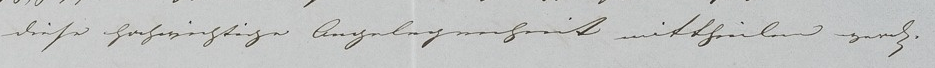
diese hochwichtige Angelegenheit mittheilen werden.
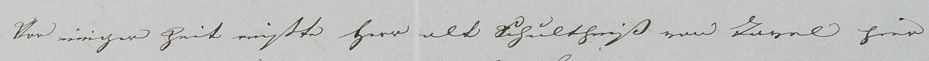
Vor einiger Zeit reißte Herr alt Schultheiß von Tavel hier
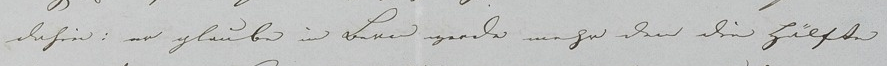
dahin: er glaube in Bern werde mehr den die Hälfte
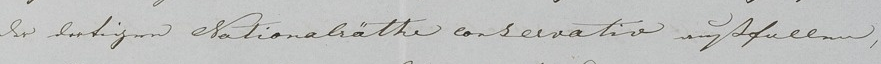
der dortigen Nationalräthe conservativ außfallen,
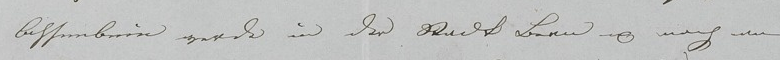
Ochsenbein werde in der Stadt Bern & noch an
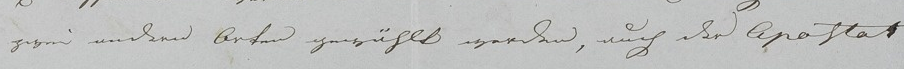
zwei andern Orten gewählt werden, auch der Apostat
